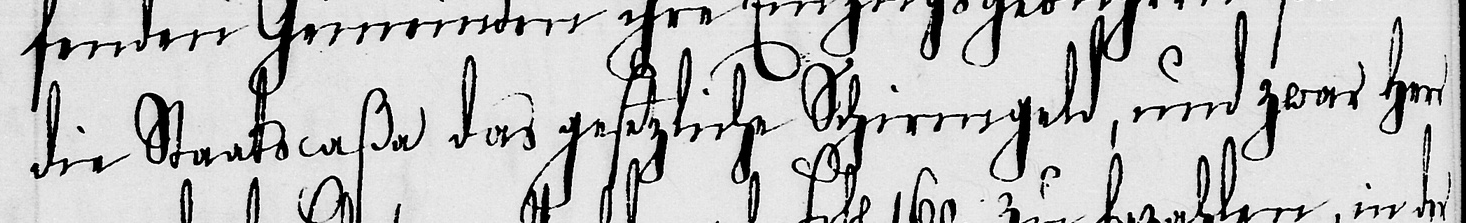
die Staatscaßa das gesetzliche Schirmgeld, und zwar Her¬
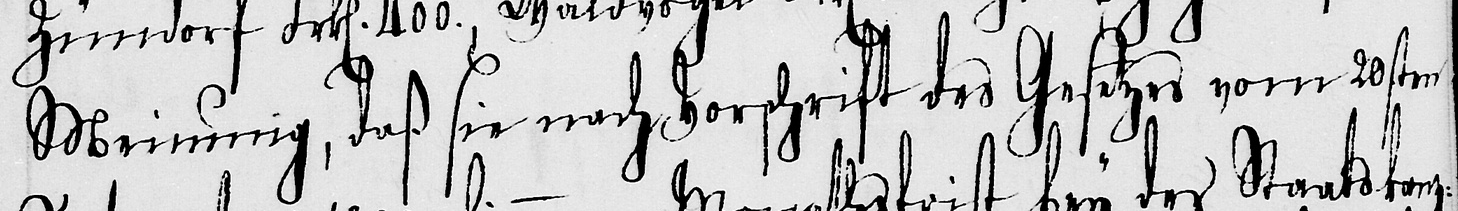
Meinung, daß sie nach Vorschrift des Gesetzes vom 20sten
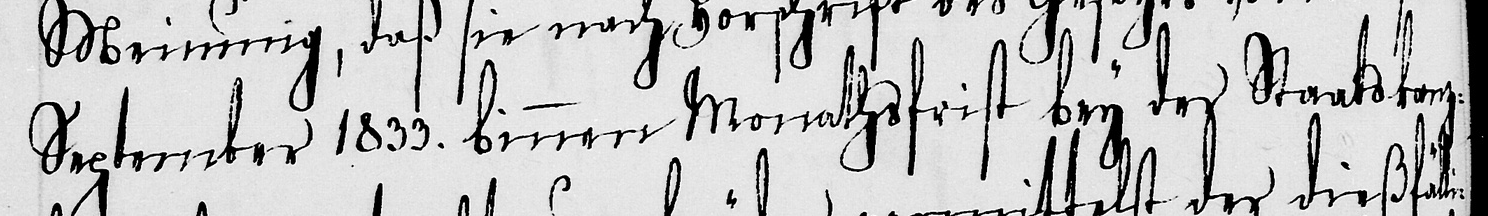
September 1833. binnen Monathsfrist bey der Staatskan¬
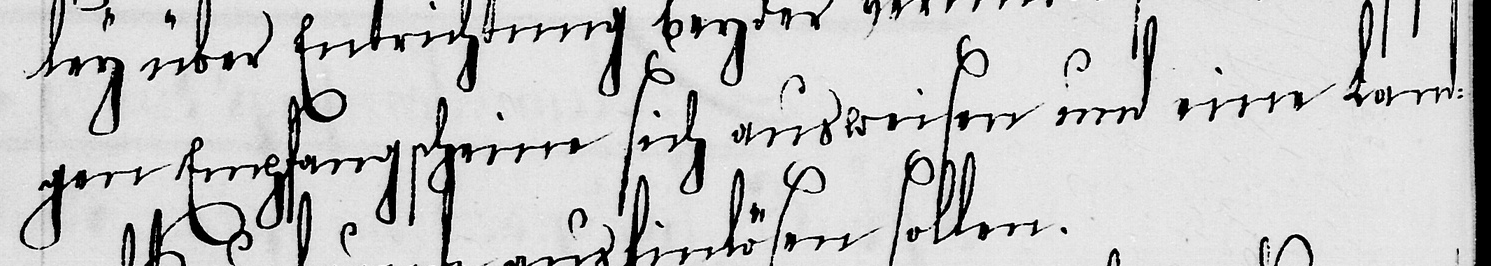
igen Empfangscheine sich ausweisen und eine Land¬
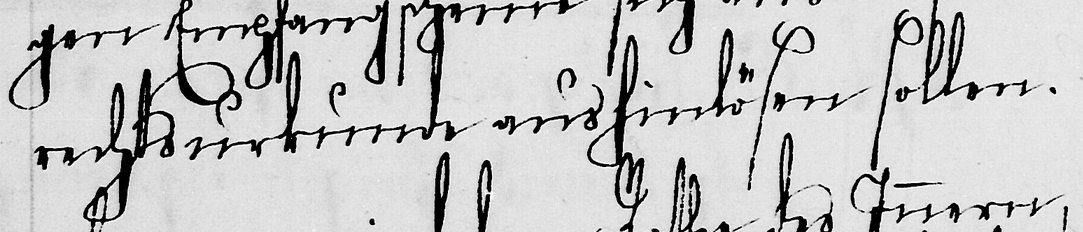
rechtsurkunde aushinlösen sollen.
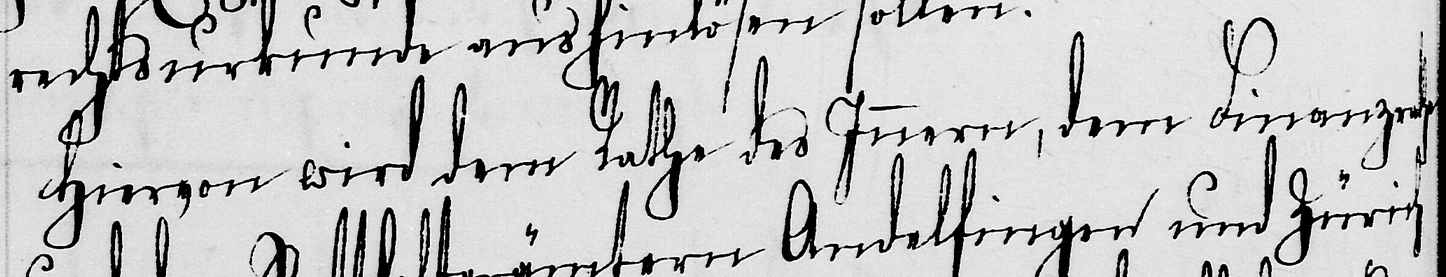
Hiervon wird dem Rathe des Innern, dem Finanzr¬
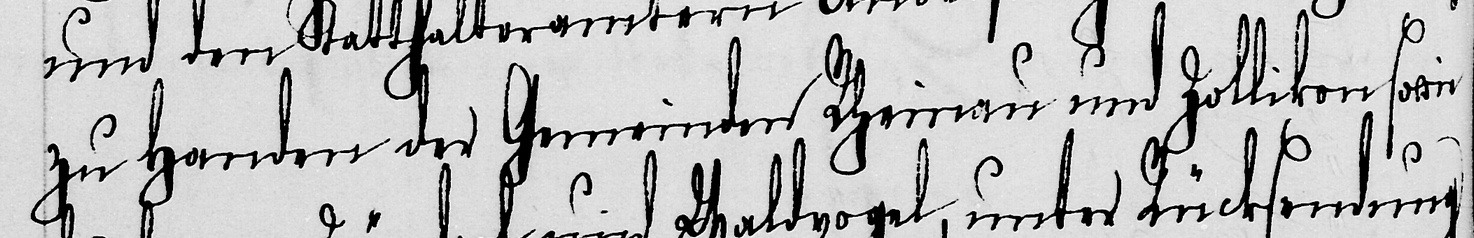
zu Handen der Gemeinden Rheinau und Zollikon
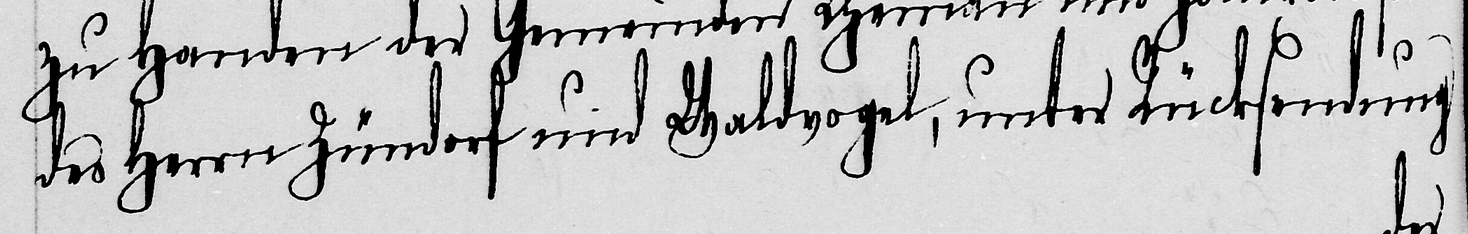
des Herrn Zündorf und Waldvogel, unter Rücksendung
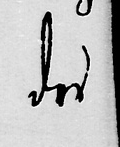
der
